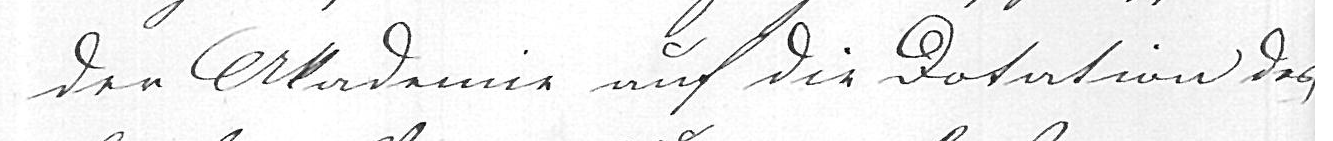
der Akademie auf die Dotation des
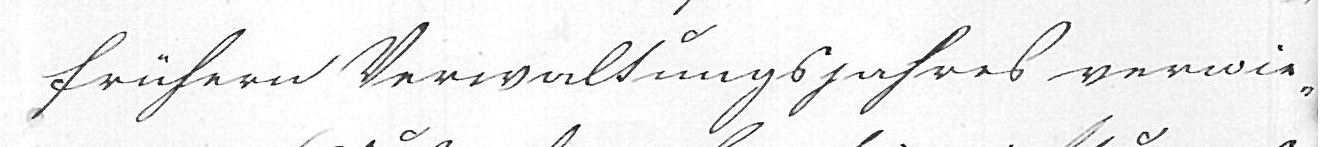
früheren Verwaltungsjahres verwie-
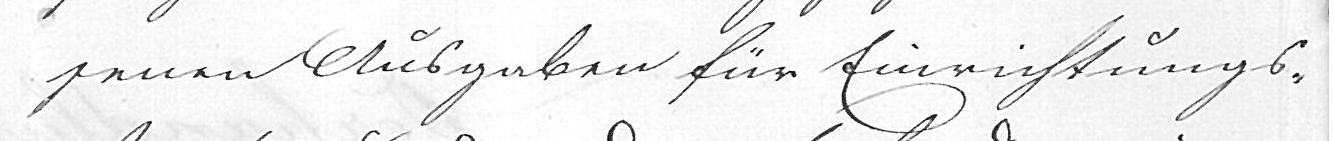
senen Ausgaben für Einrichtungs-
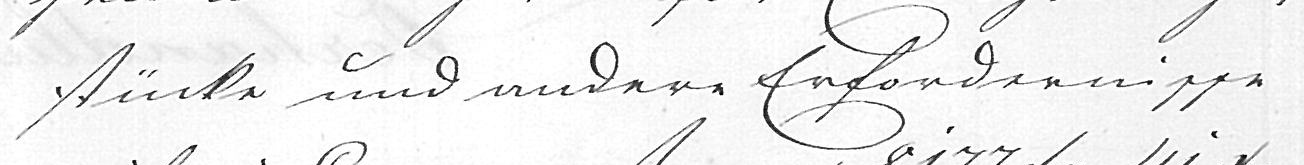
stücke und andere Erfordernisse
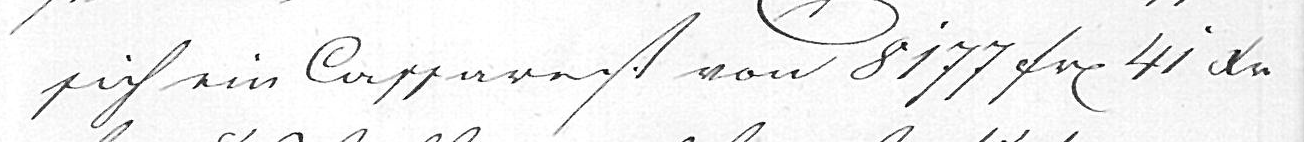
sich ein Cassarest von 8177 fr 41 kr
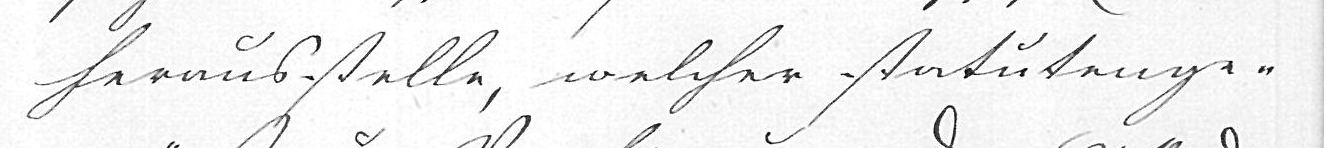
herausstelle, welcher statutenge-
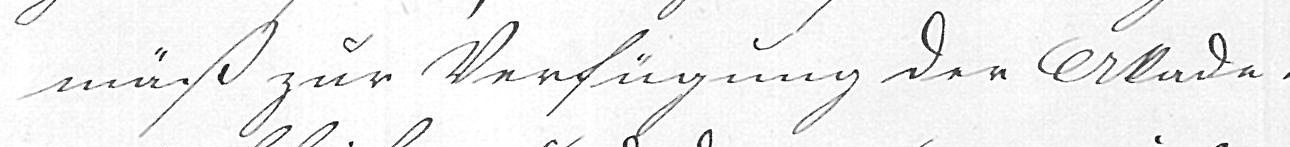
mäß zur Verfügung der Akade-
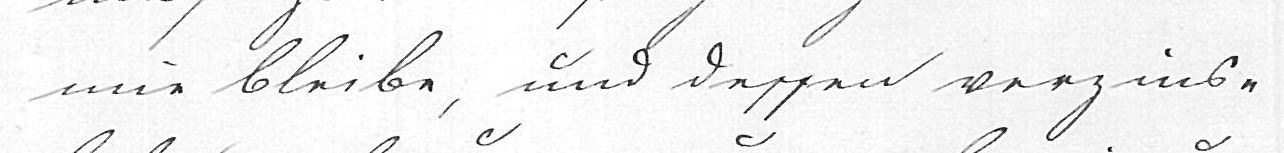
mie bleibe, und dessen verzins-
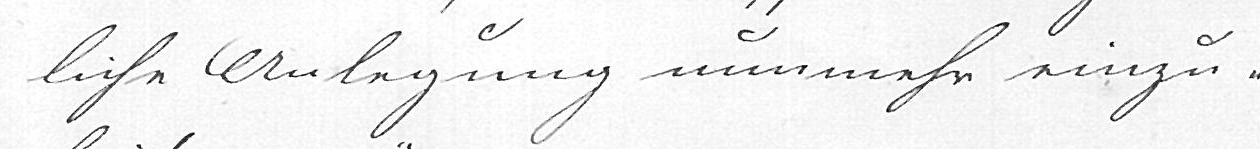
liche Anlegung nunmehr einzu-
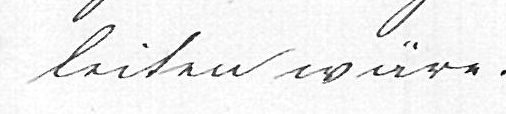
leiten wäre.
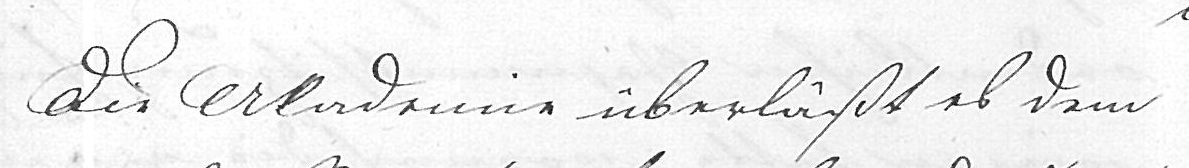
Die Akademie überläßt es dem
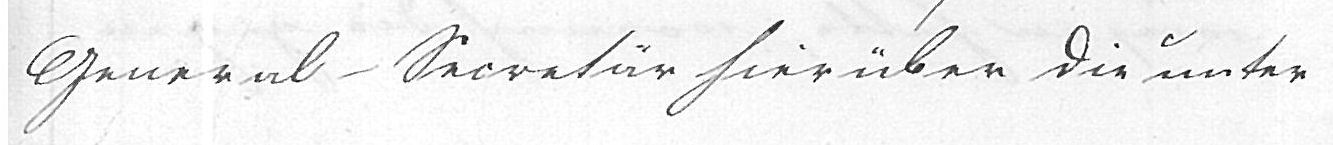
General-Secretär hierüber die unter
